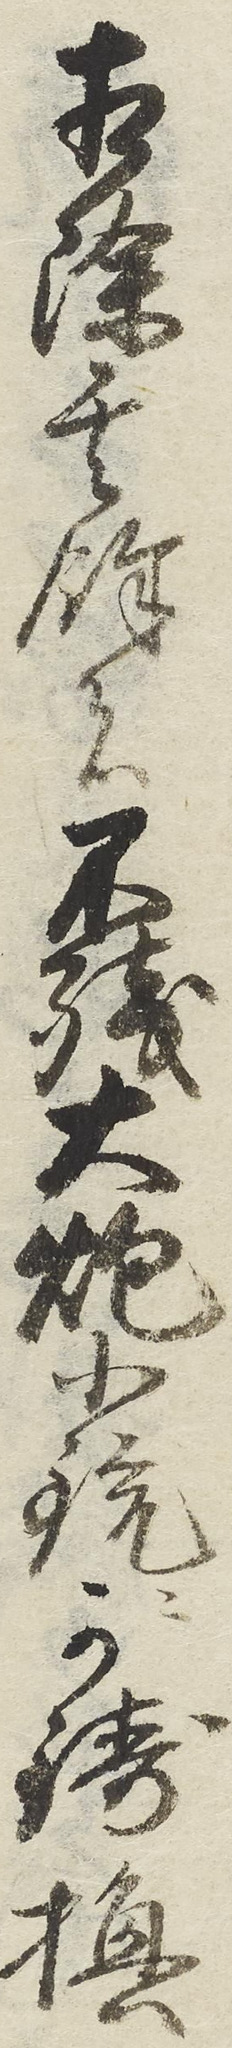相除其余は不残大炮小銃二可鋳換
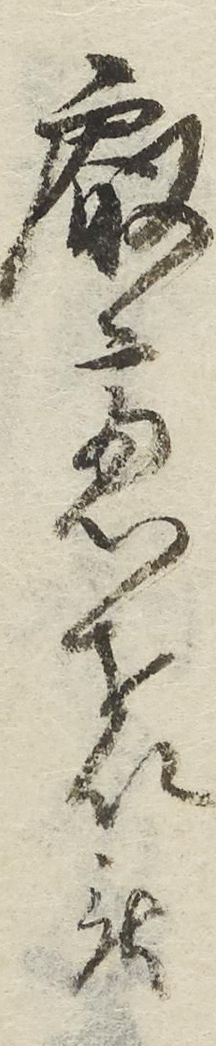叡慮を以被
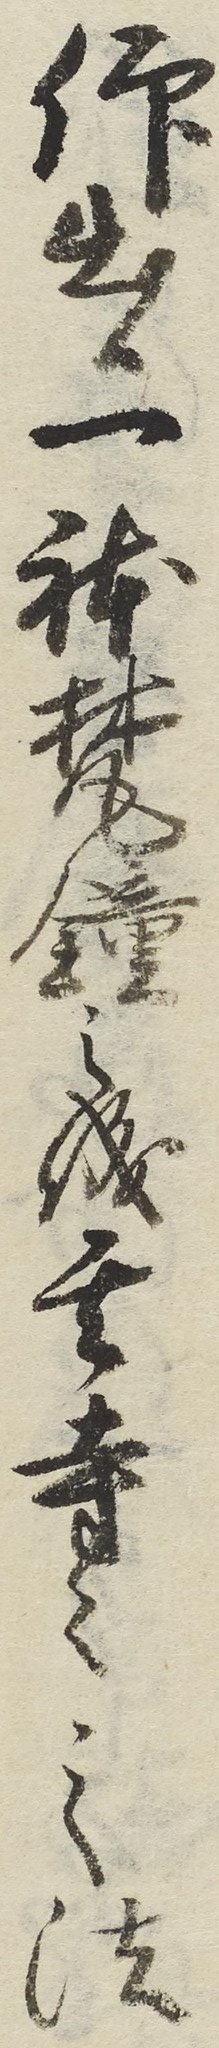仰出候一体梵鐘之儀其寺々之法

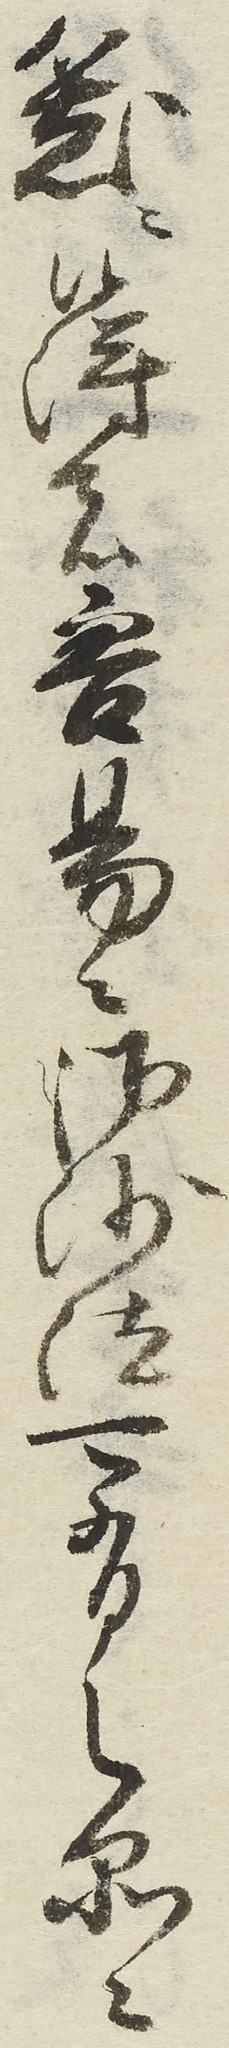器二候得は容易二御沙汰可有之品二
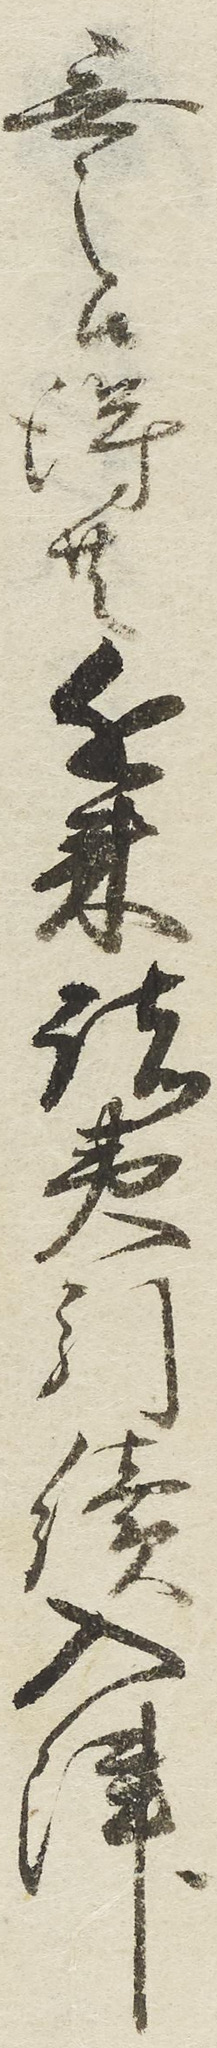無之候得共近来諸夷引続入津
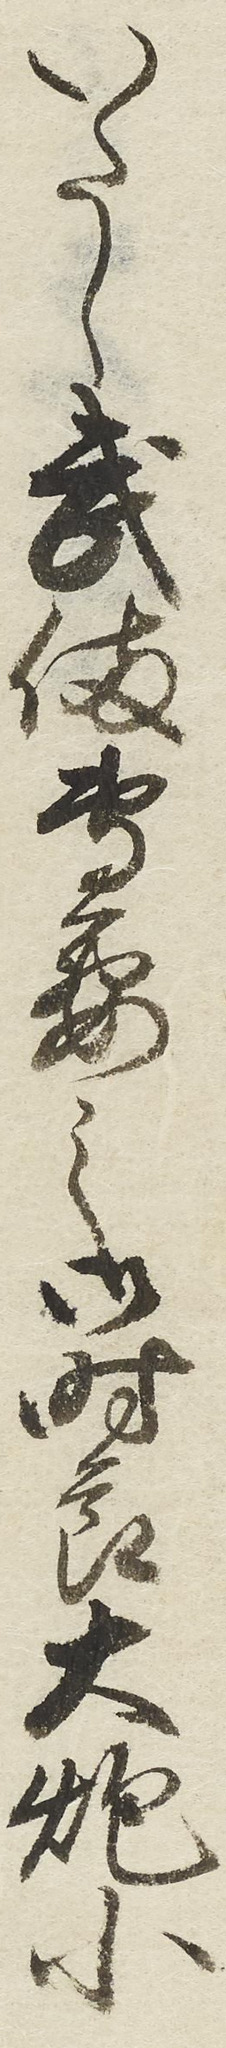いたし武備専要之御時節大炮小
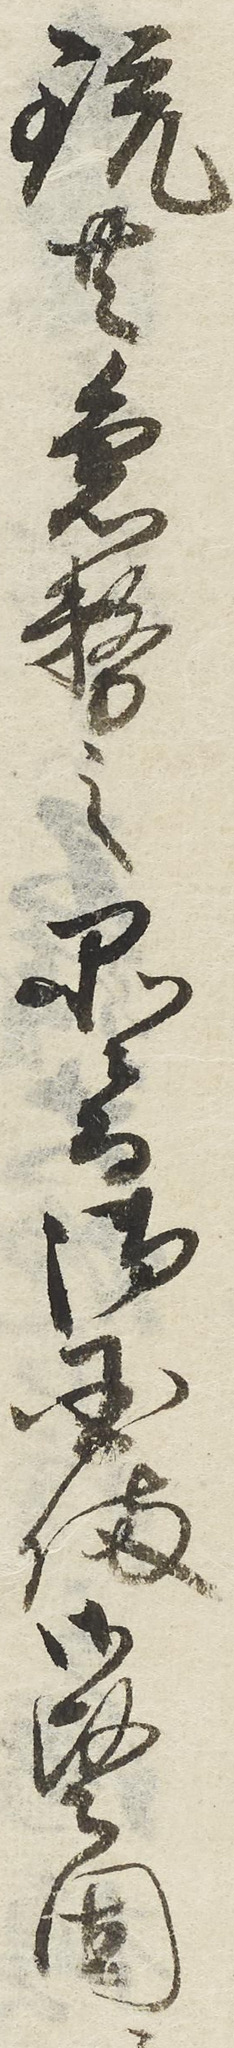銃共急務之品二而御国備御堅固二
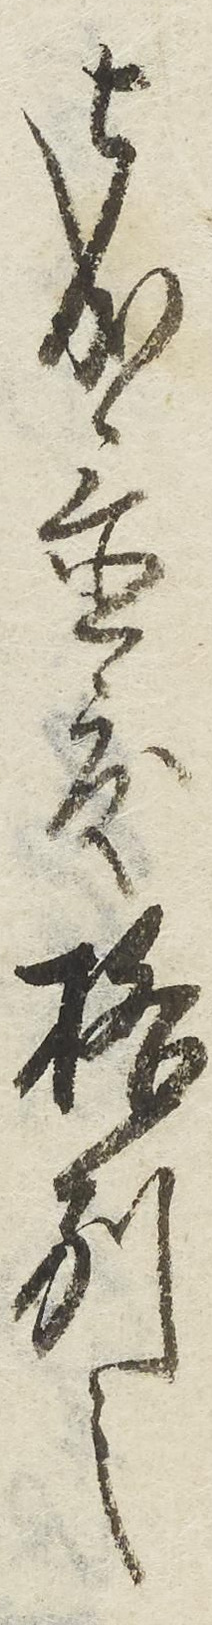被成置度格別之
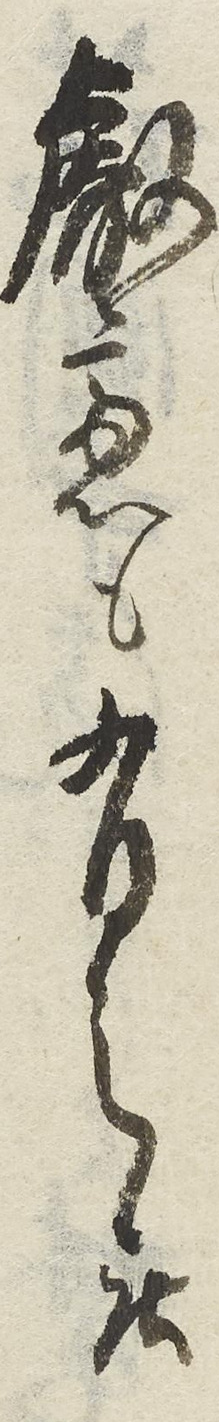叡慮も有之被
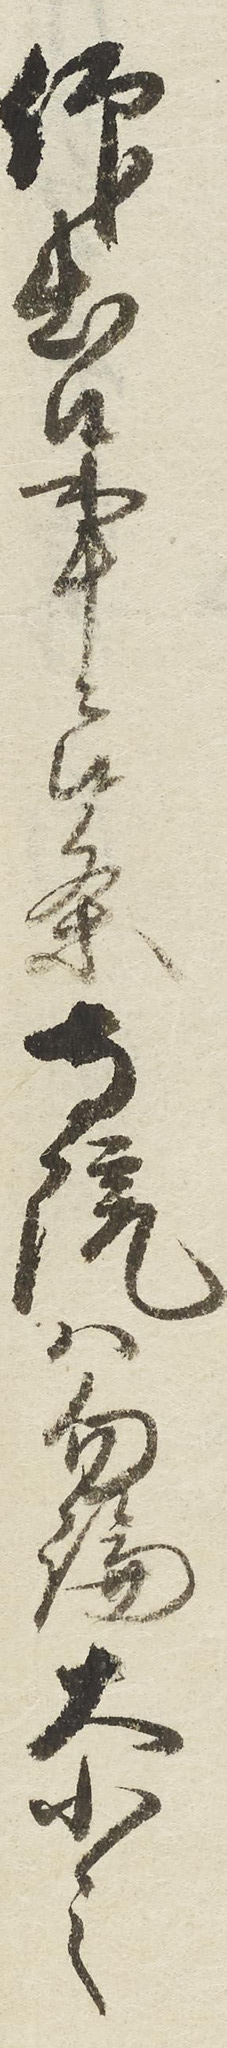仰出候事二候条寺院ハ勿論大小之
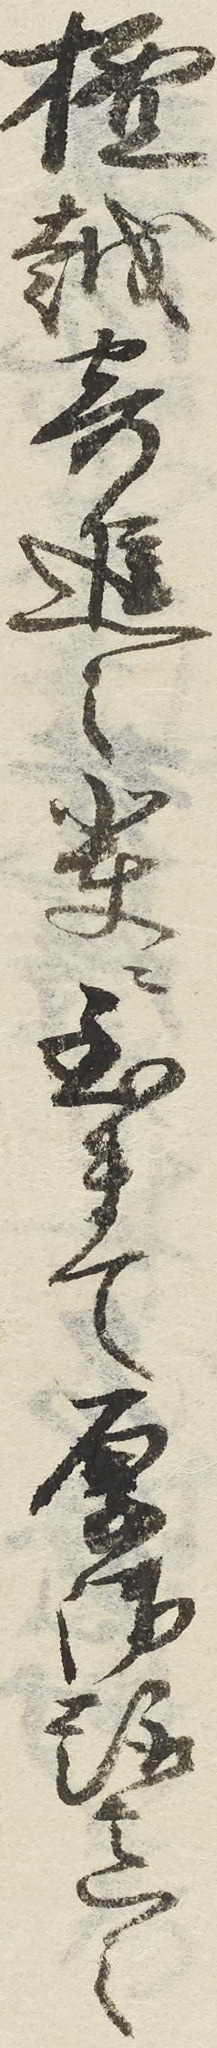檀を寄進之輩二至まて厚御趣意之
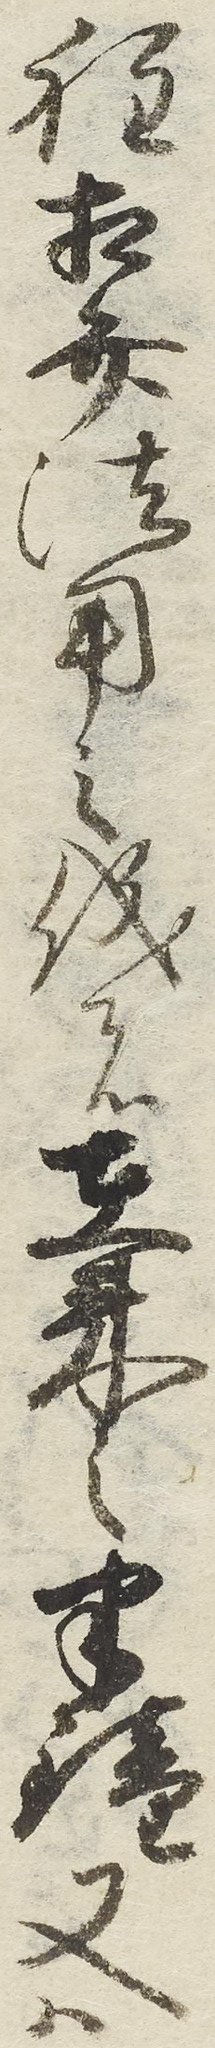程相弁法用の儀は在来之半鐘又ハ
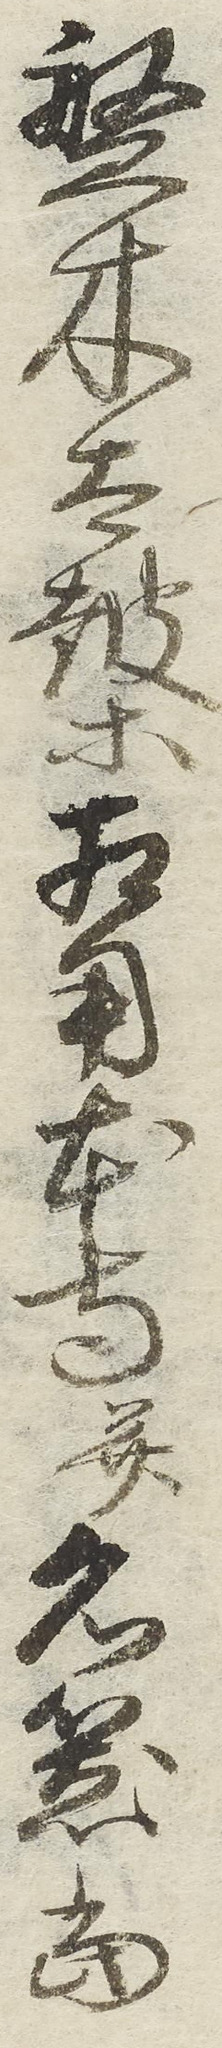盤木太鼓等相用本寺并名器当
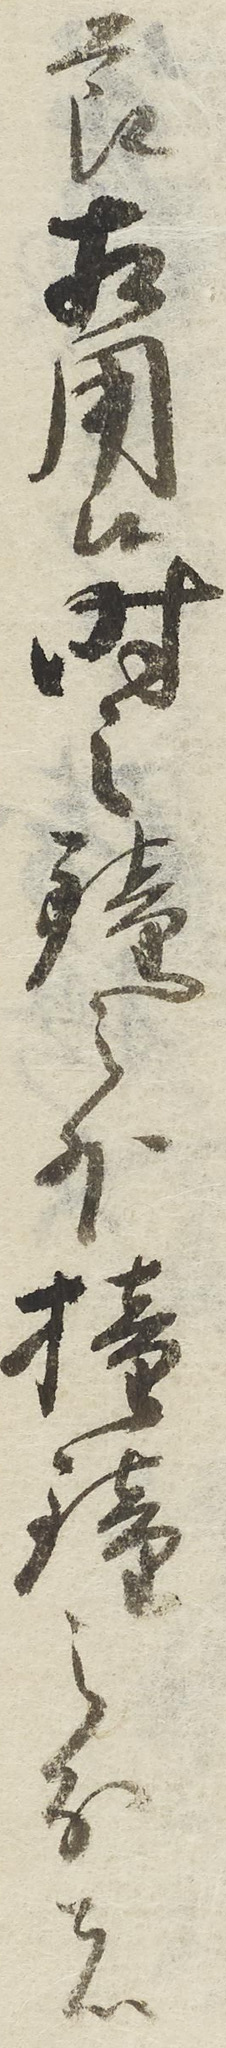節相用候時之鐘之外撞鐘之分は
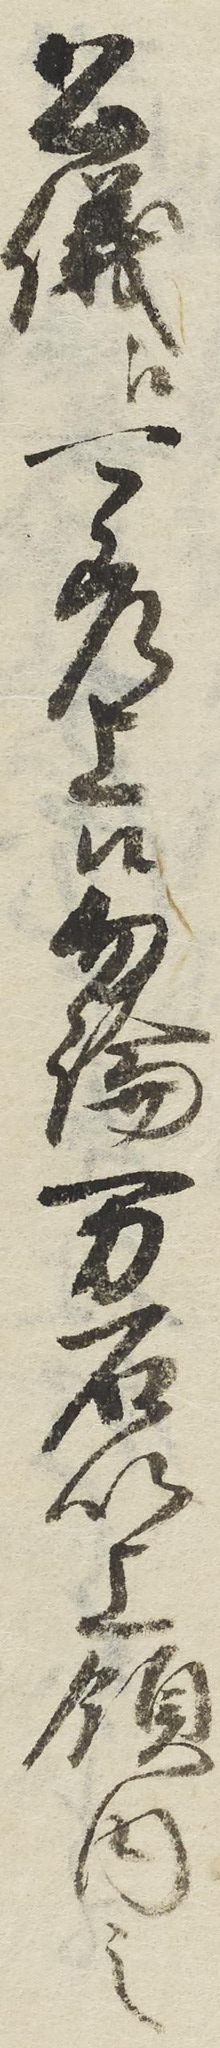公儀江可差上候勿論万石以上領内之
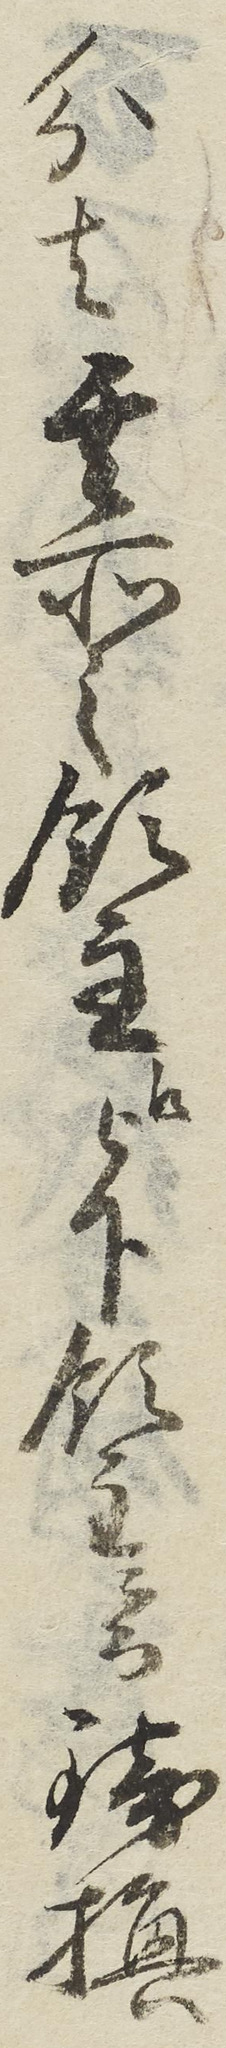分は其所之領主江被下領主二而鋳換
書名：[梵鐘差出一件]
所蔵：東京大学地震研究所図書室 Earthquake Research Institute Library, The University of Tokyo, JAPAN
